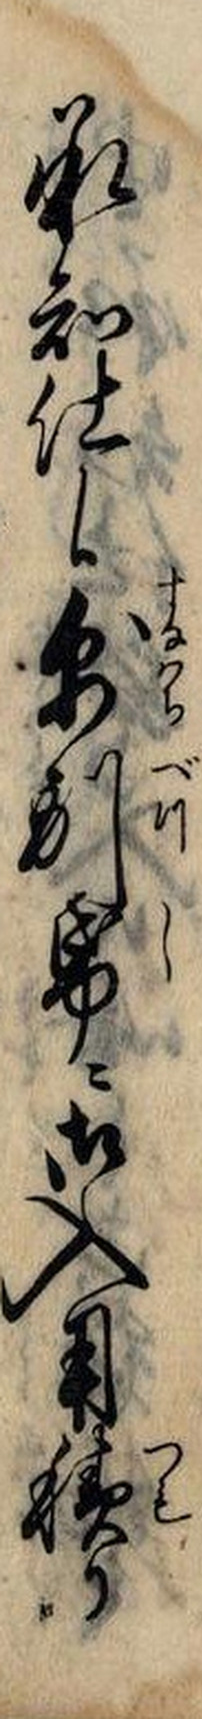承知仕候則別紙に御入用積り
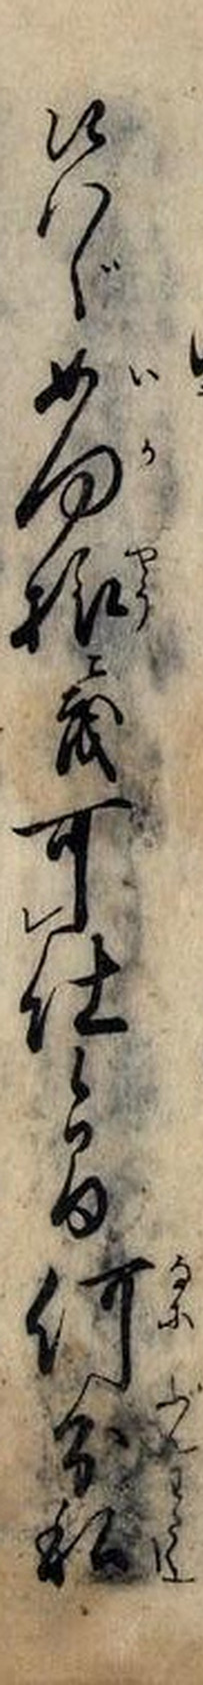候はゞ如何様にも可仕候間何分私

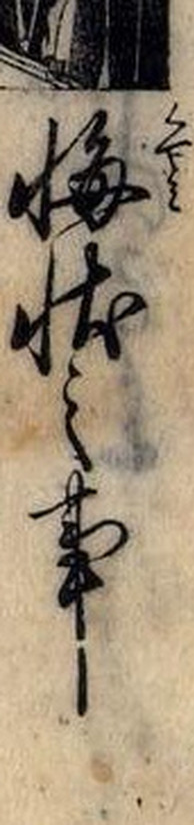悔状之事
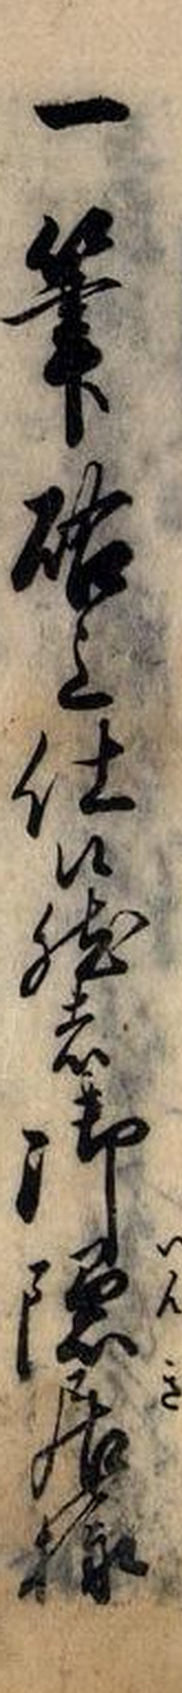一筆啓上仕候然者御隠居様
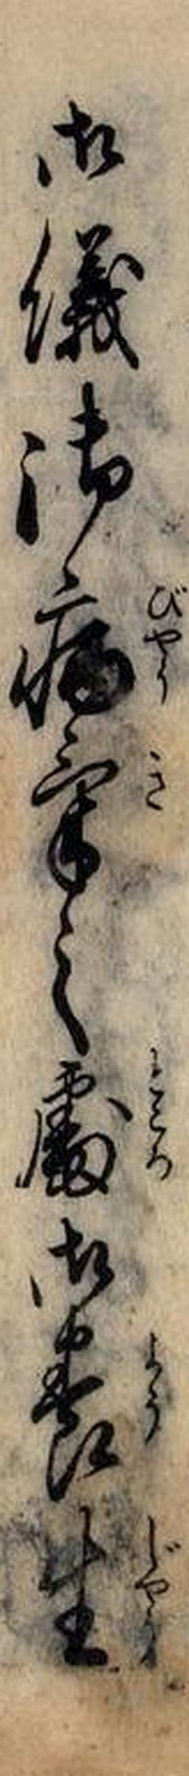御儀御病氣之處御養生
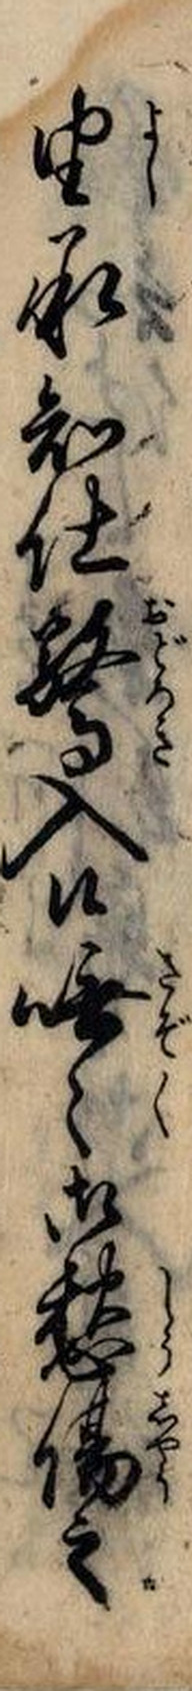由承知仕驚入候嘸々御愁傷之
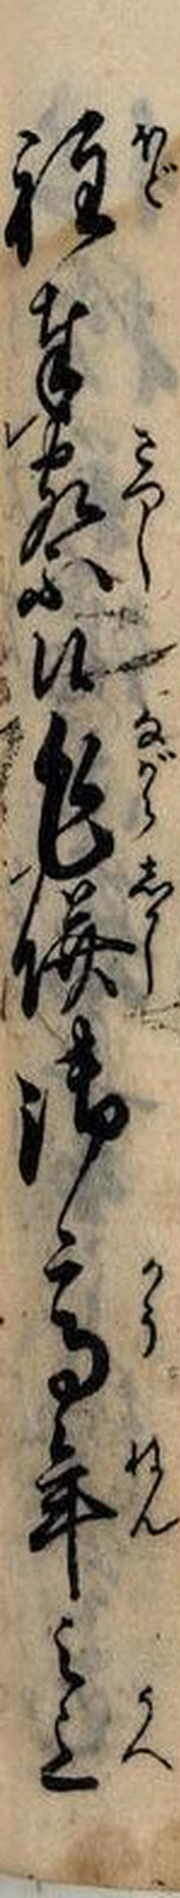程奉察候乍併御高年之上
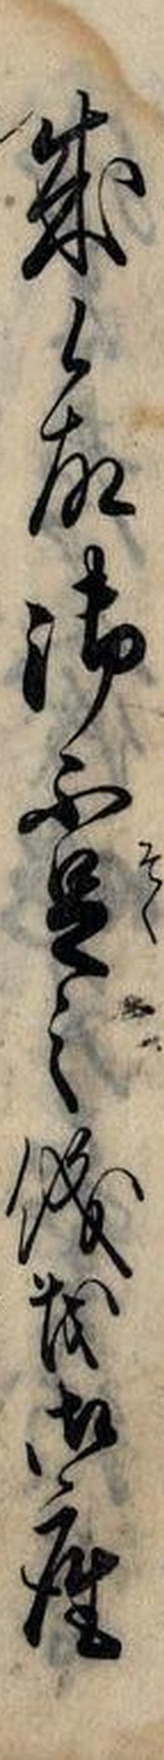成候故御ふ足之儀も御座
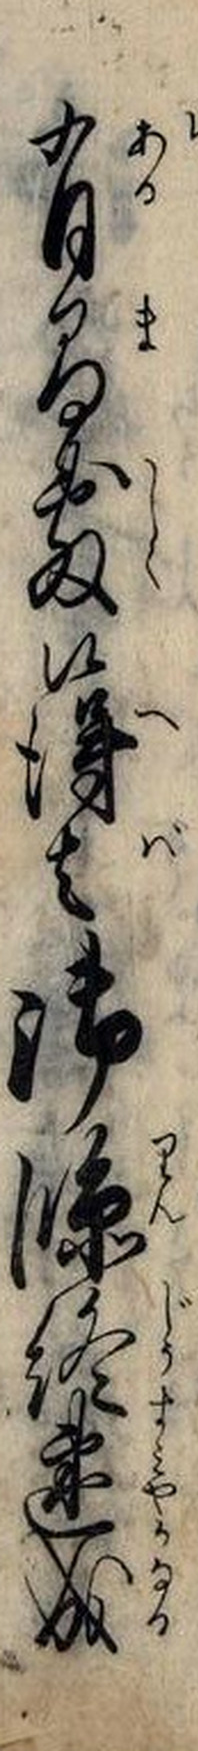有間敷候得者御臨終速成
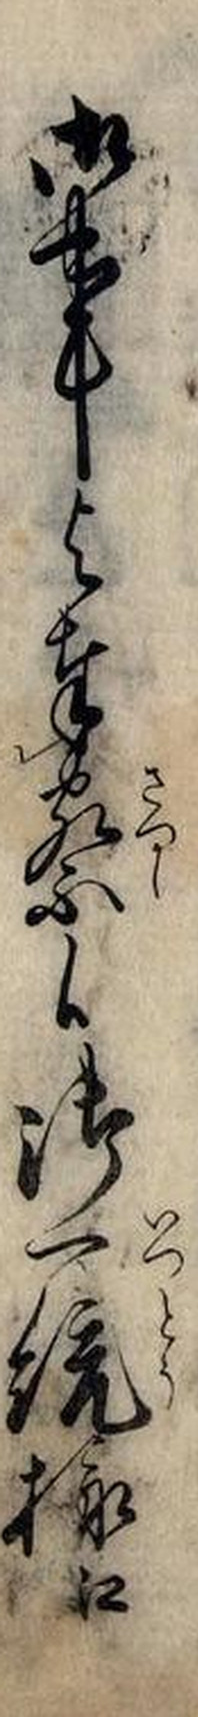御事与奉察候御一統様江
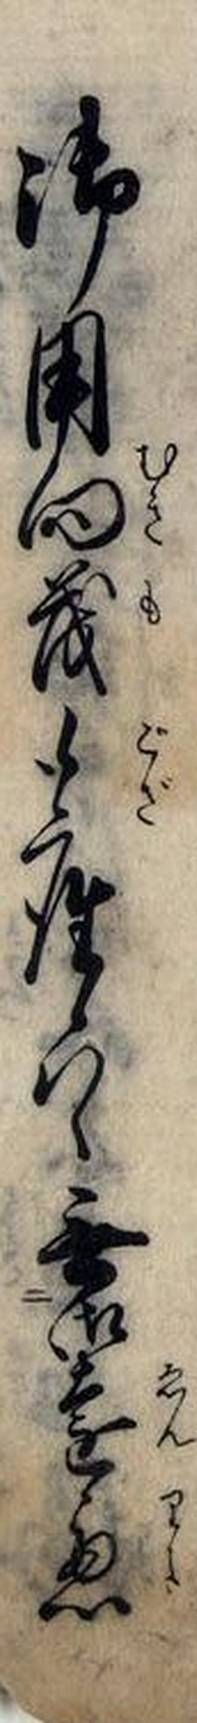御用向も御座候はゝ無御遠慮

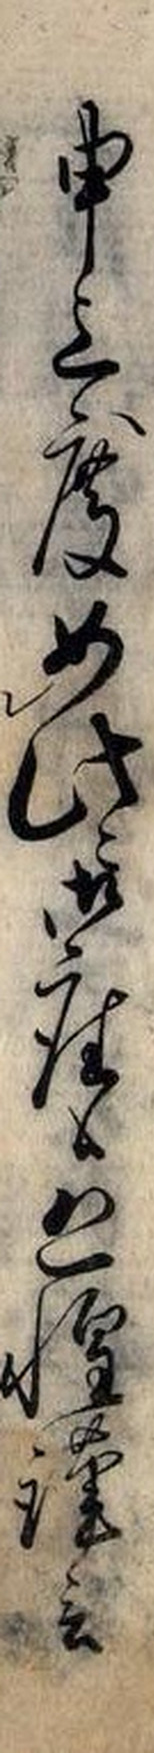申上度如此に御座候恐惶謹言
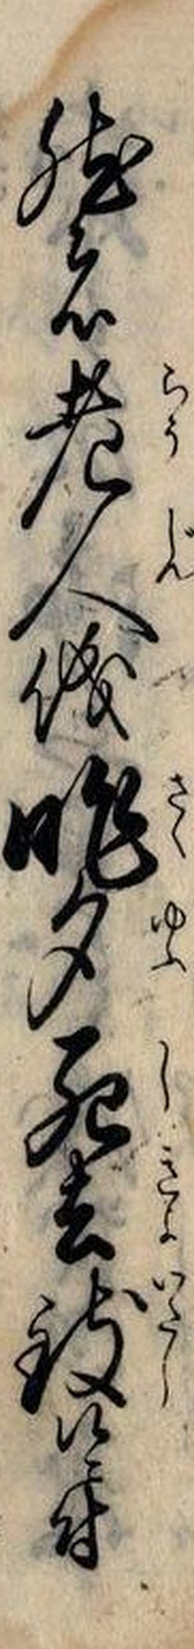然者老人儀昨夕死去致候に付
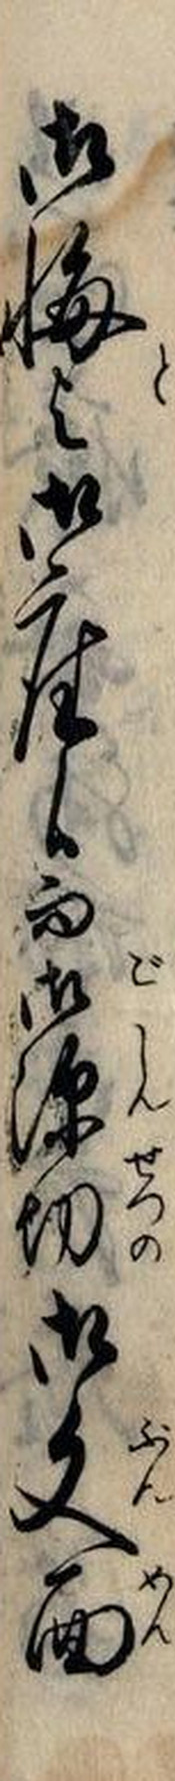御悔与御座候而御深切御文面
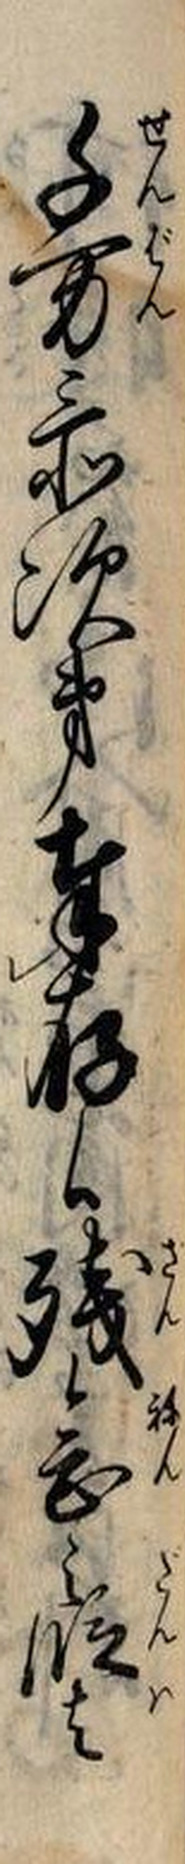千万忝次第奉存候残念之段者
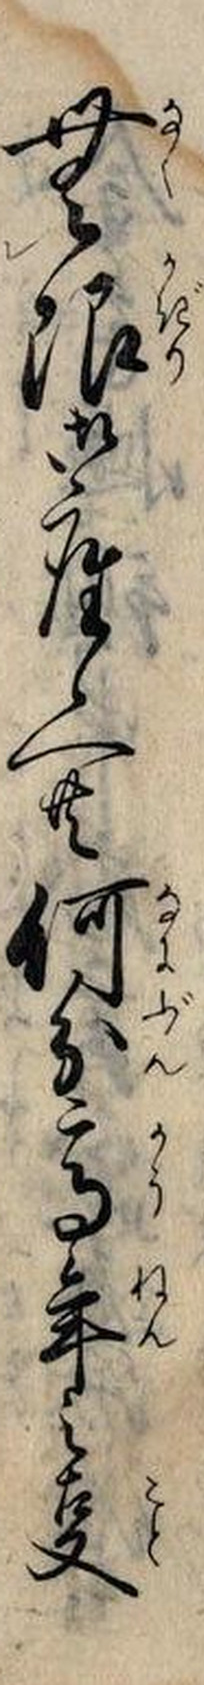無限御座候ヘ共何分高年之叓
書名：大成用文章（往来物）
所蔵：福井県文書館 Fukui Prefectural Archives
